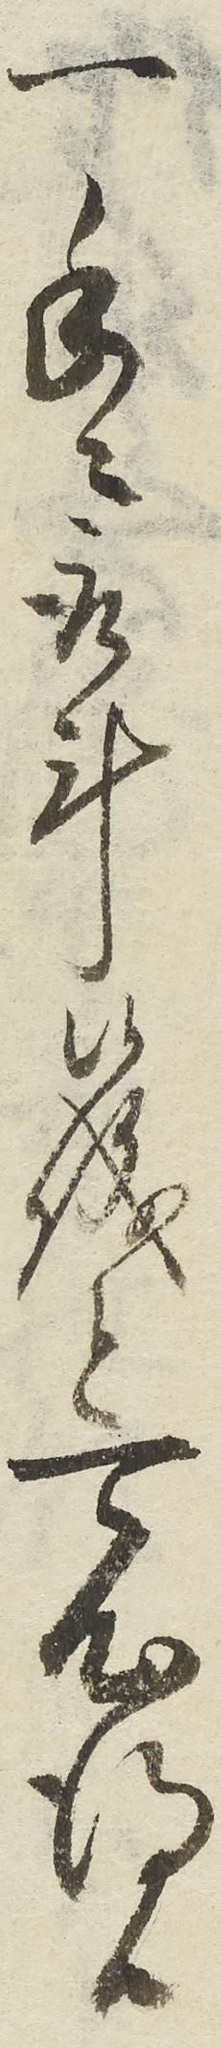一手二取斗候儀と可心得候
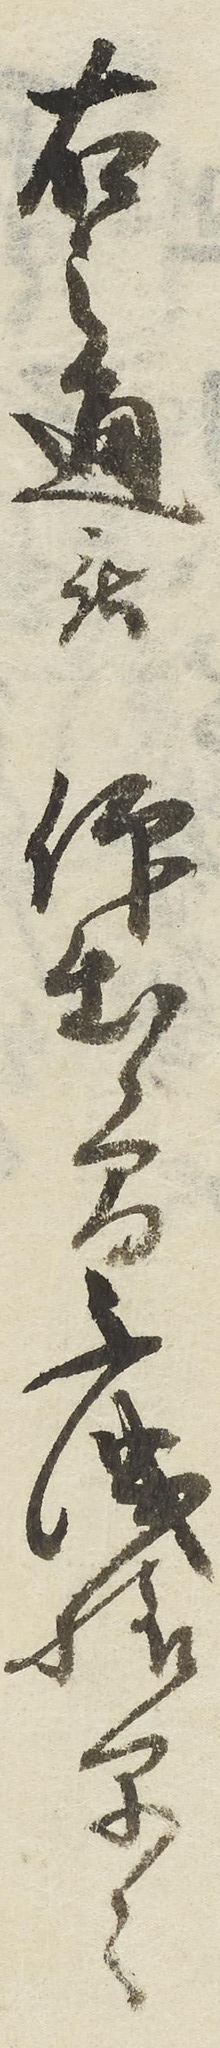右之通被仰出候間不洩様早々
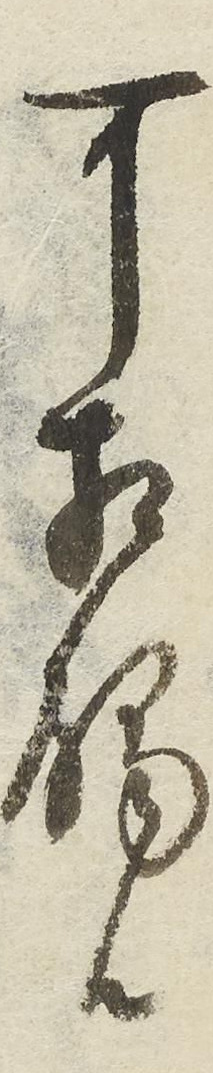可相觸候
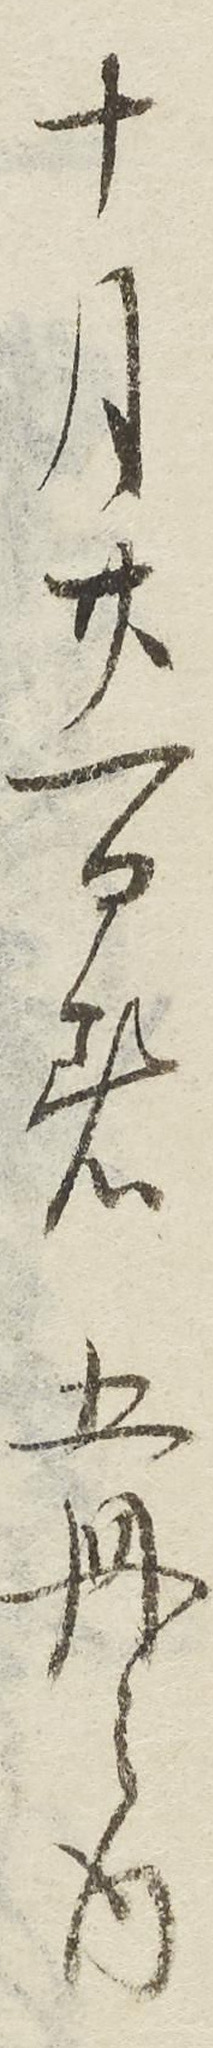十月廿一日着五冊之内
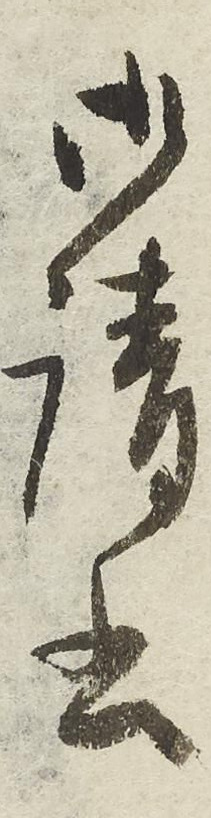御請書
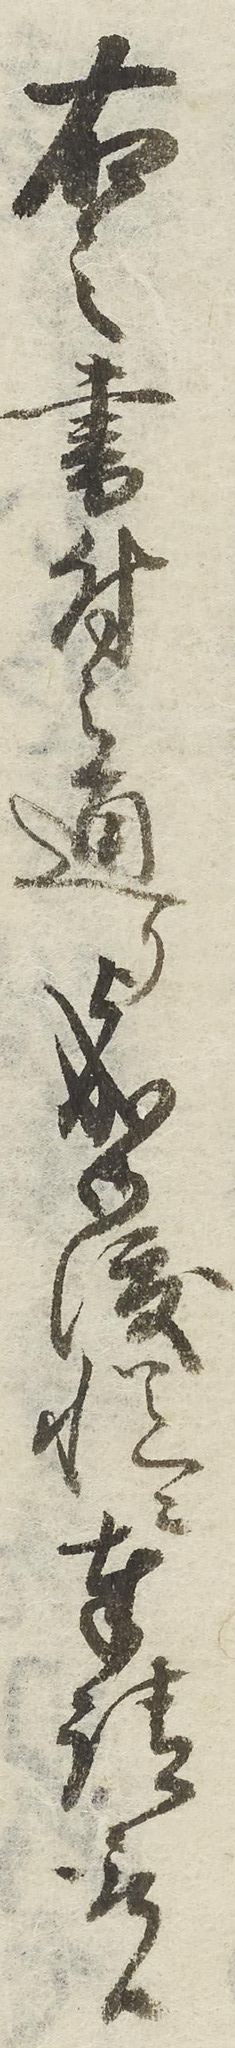右之書付之通り被成御渡慥二奉請取候
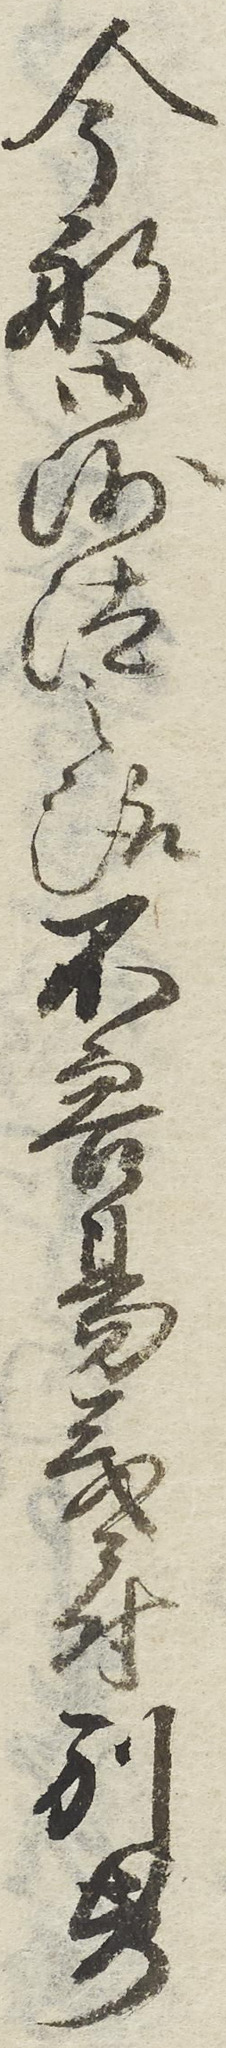今般御沙汰之趣不容意義二付別紙
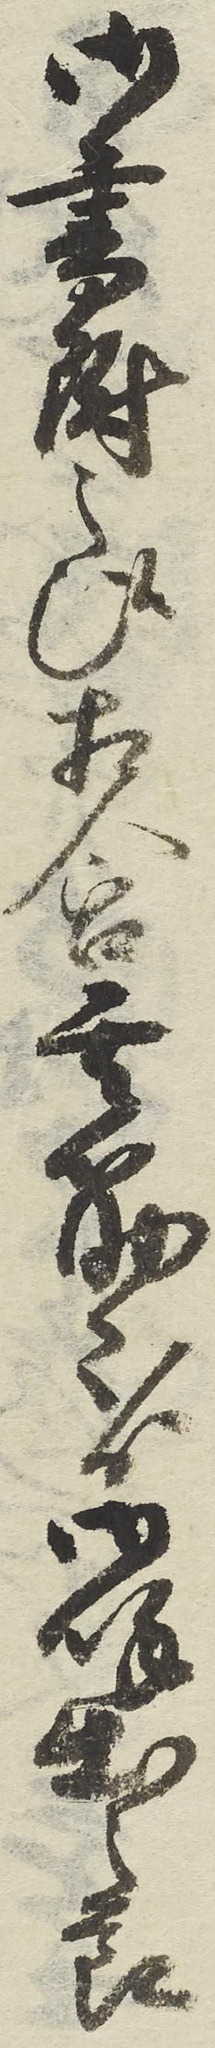御書付之趣相含其筋々ゟ御呼出之節
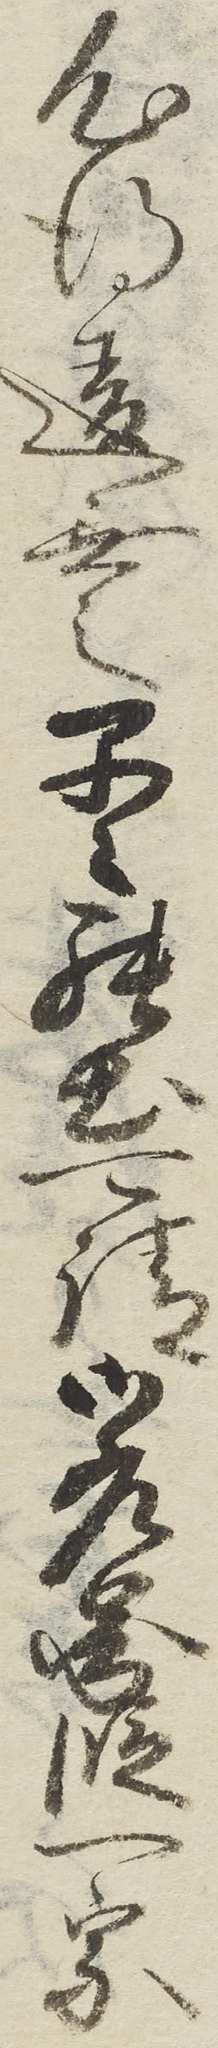心得違無之早々罷出可請御差図段一宗
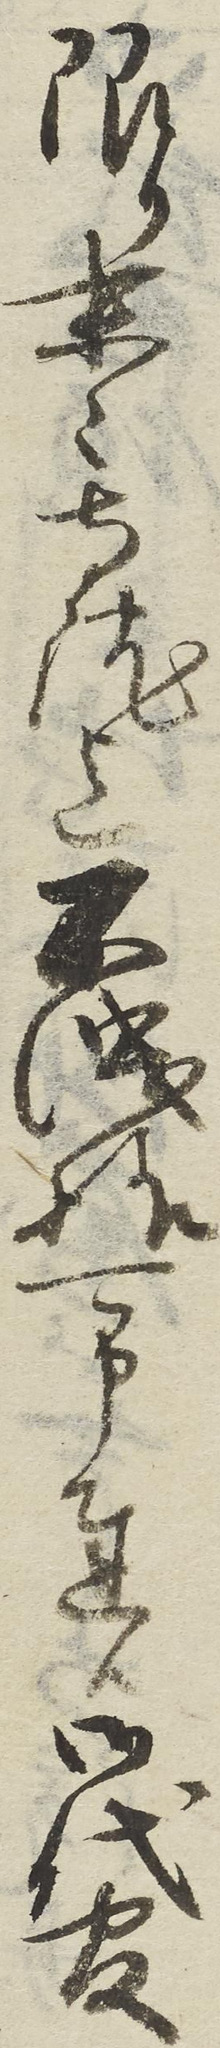限り未々寺院迄不洩様可申達候御代官

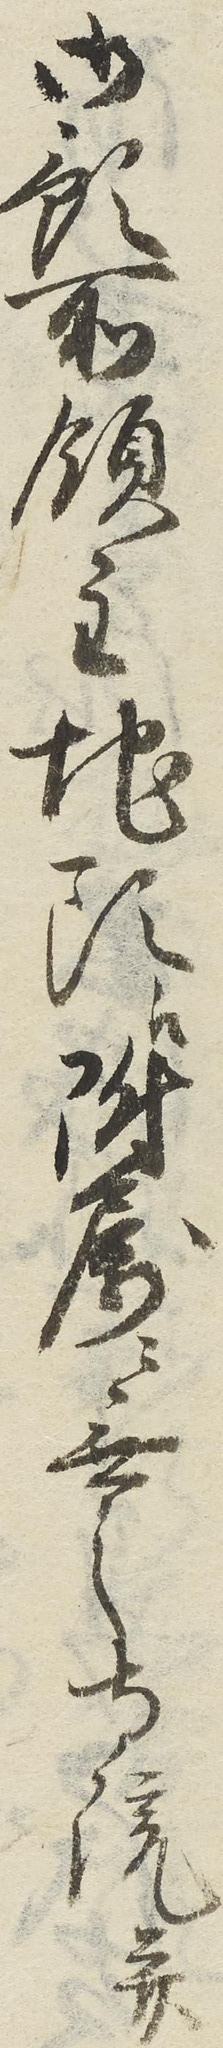御預所領主地頭江附属二無之寺院并
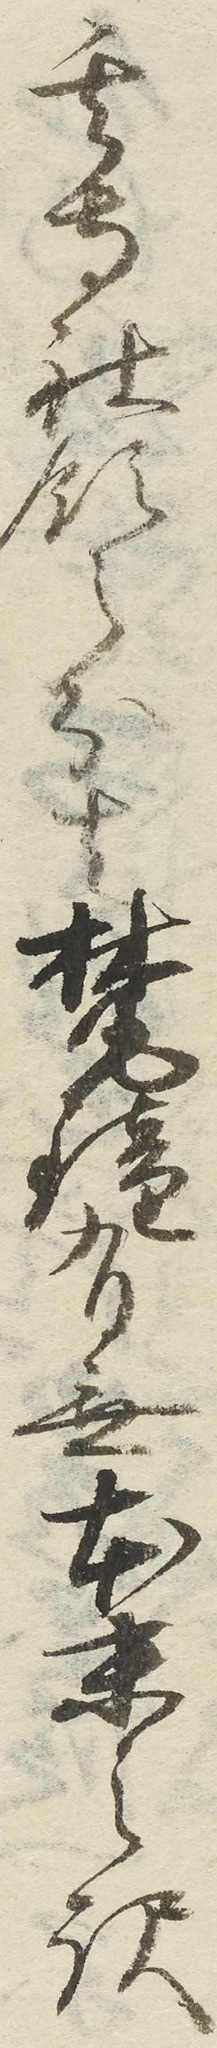其寺社領之分は梵鐘有無本末之訳
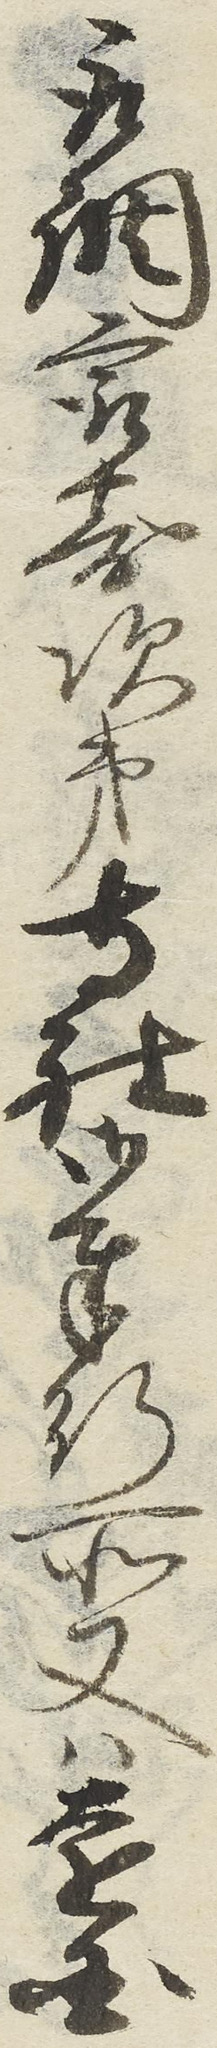取調最寄次第寺社御奉行所又ハ遠国
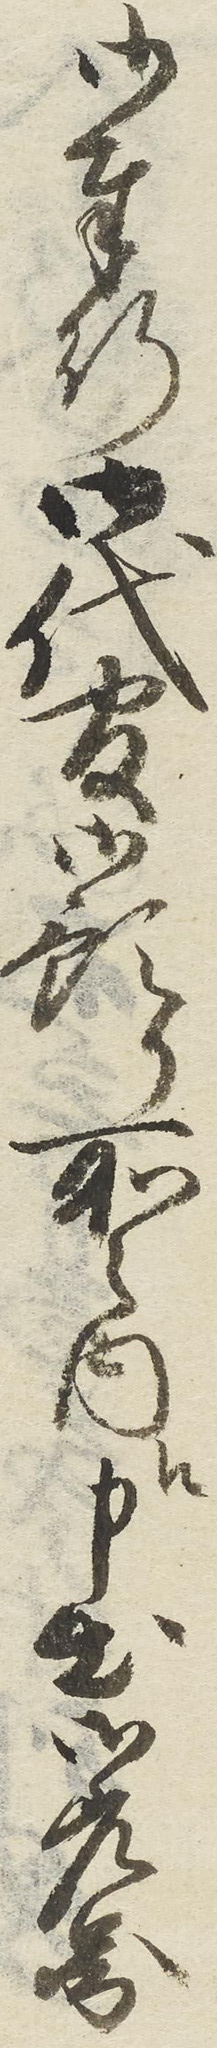御奉行御代官御預り所之内江申出御差図
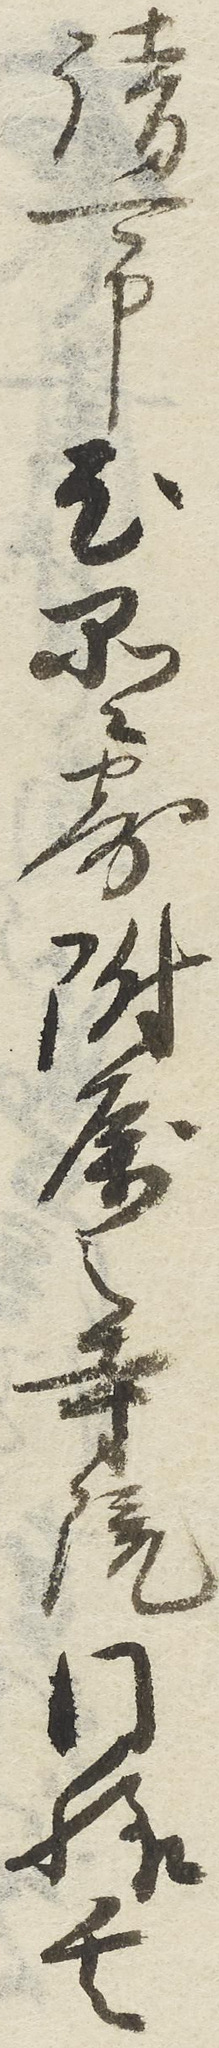請可申尤品二寄附属之寺院同様其
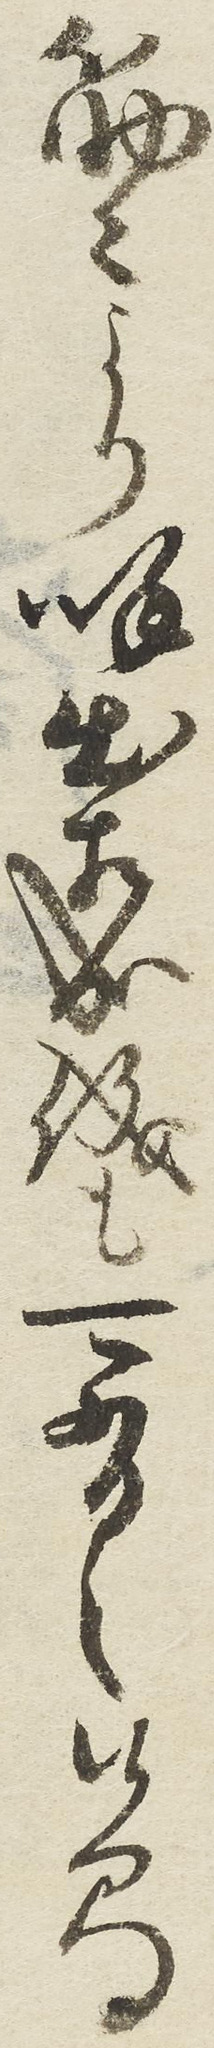筋々より呼出相成儀も可有之候間
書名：[梵鐘差出一件]
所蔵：東京大学地震研究所図書室 Earthquake Research Institute Library, The University of Tokyo, JAPAN
